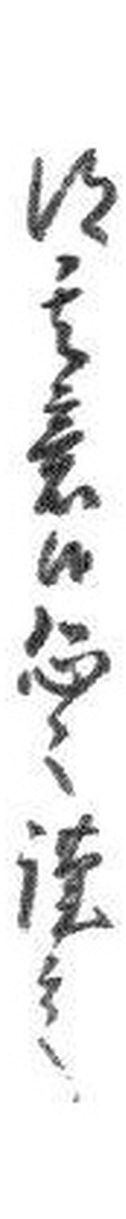得其意候恐々謹言
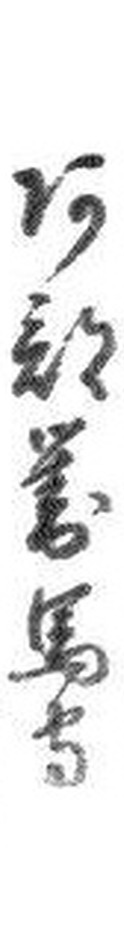阿部対馬守
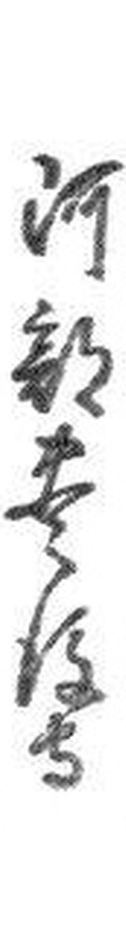阿部豊後守
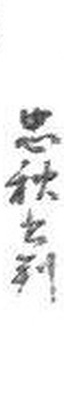忠秋書判
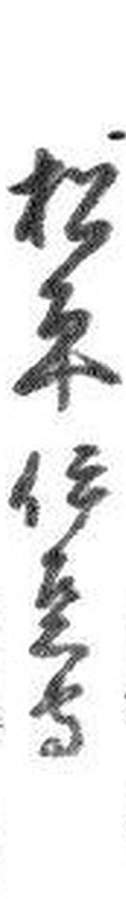松平伊豆守
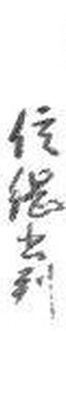信綱書判
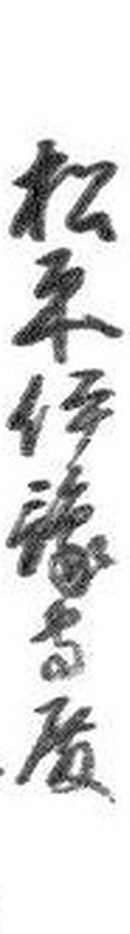松平伊予守殿

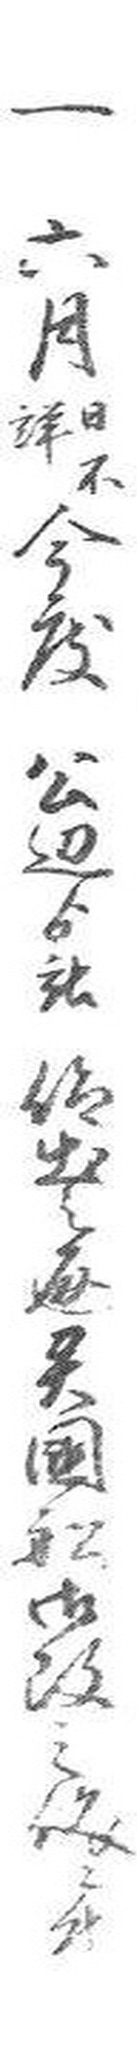一六月日不詳今度公辺ゟ被仰出之通異国船御改之儀ニ付
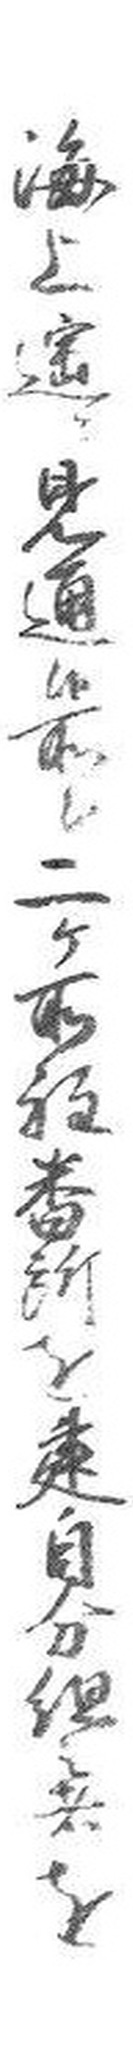海上遥ニ見通候処江二ヶ所程番所を建自分組之者を
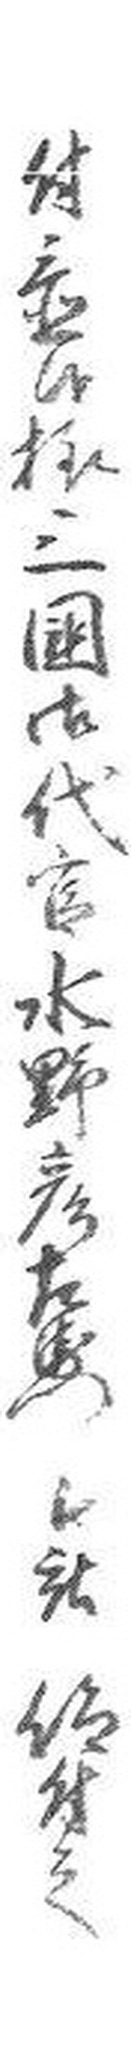付置候様三国御代官水野彦左衛門江被仰付之
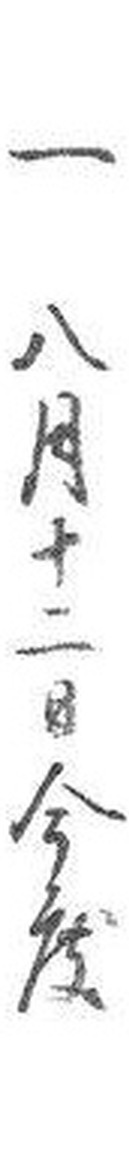一八月十二日今度
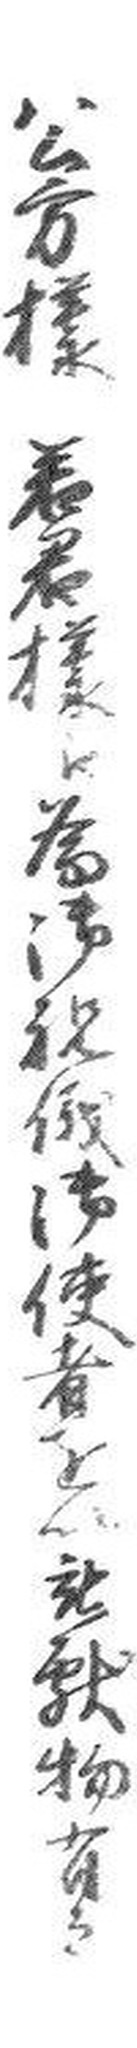公方様若君様江為御祝儀御使者を以被献物有之
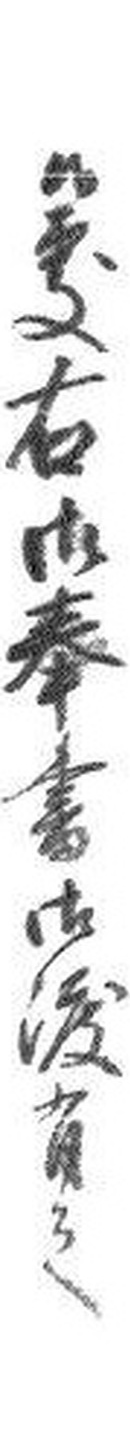候処右奉書御渡有資
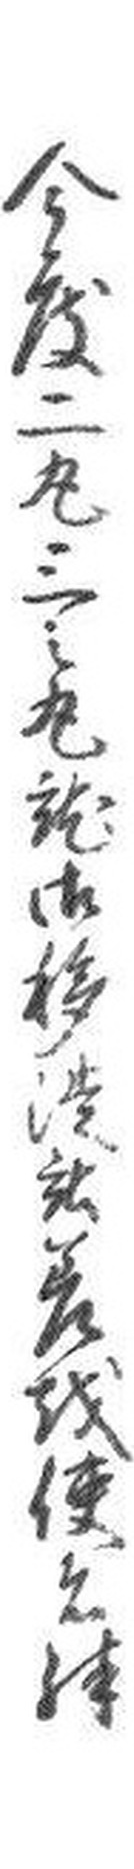今度二丸三之丸就御移徙被差越使者殊
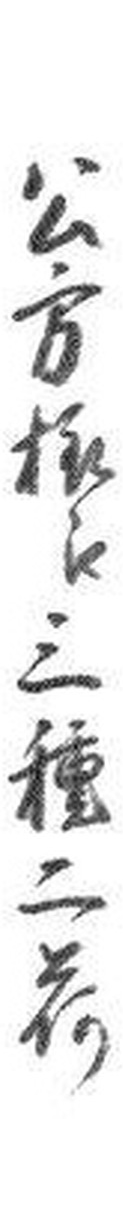公方様江三種二荷
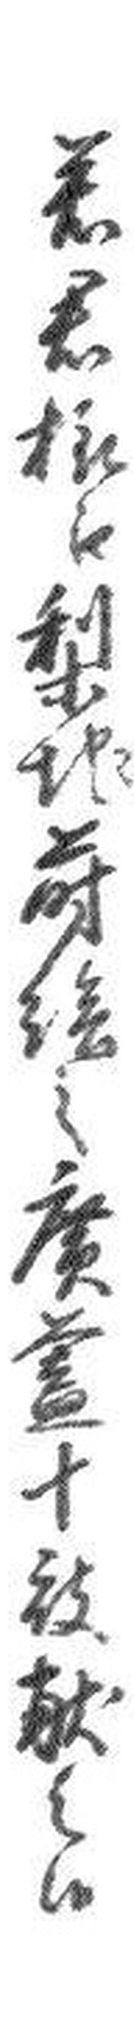若君様江梨地蒔絵之広蓋十被献之候
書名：家譜 四 忠昌公 従寛永七年到正保四年
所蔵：福井県文書館 Fukui Prefectural Archives
